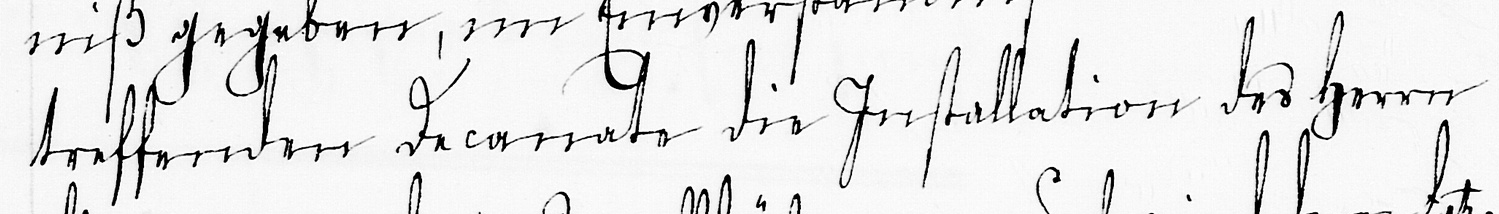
treffenden Decanate die Installation des Herrn
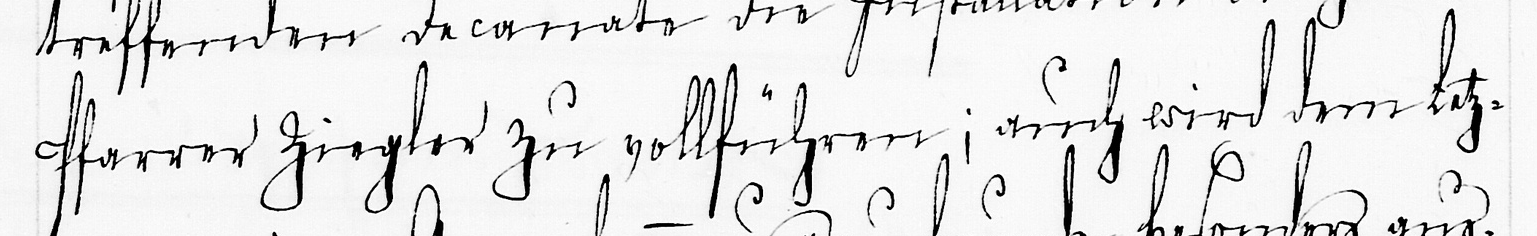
Pfarrer Ziegler zu vollführen; auch wird dem Letz¬
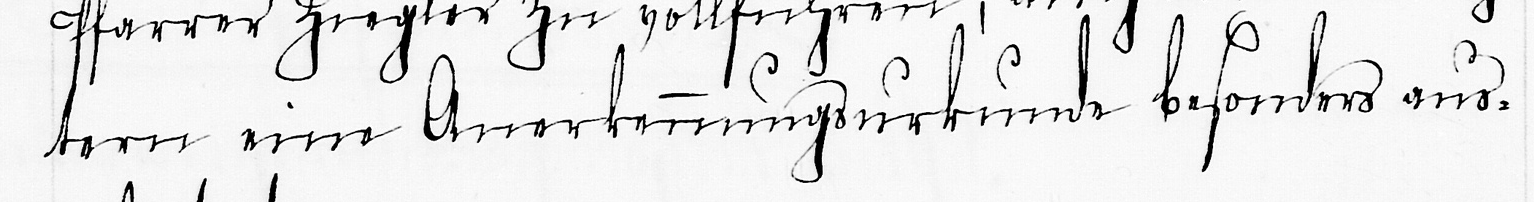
tern eine Anerkennungsurkunde besonders aus¬
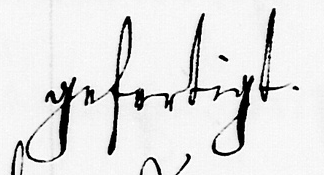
gefertigt.
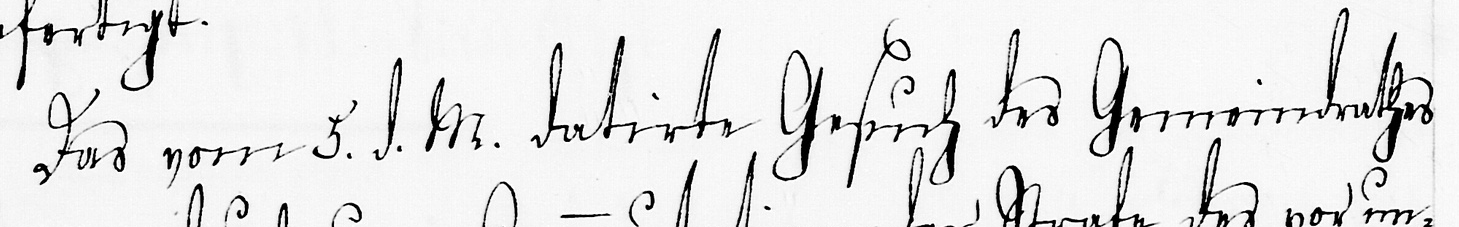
Das vom 5. d. M. datirte Gesuch des Gemeindrath¬
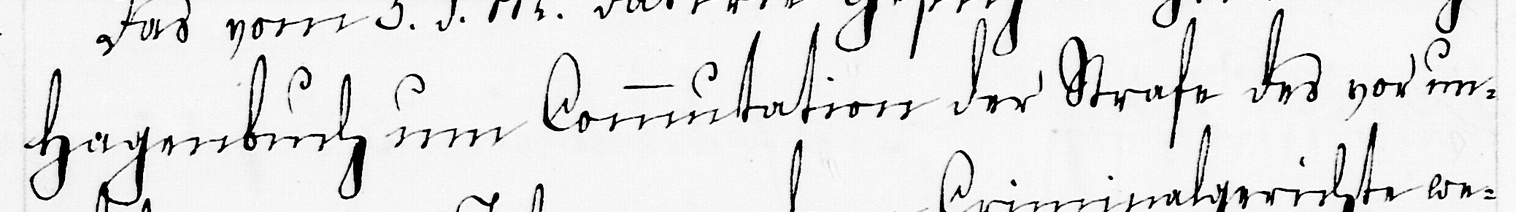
Hagenbuch um Commutation der Strafe des vor un¬
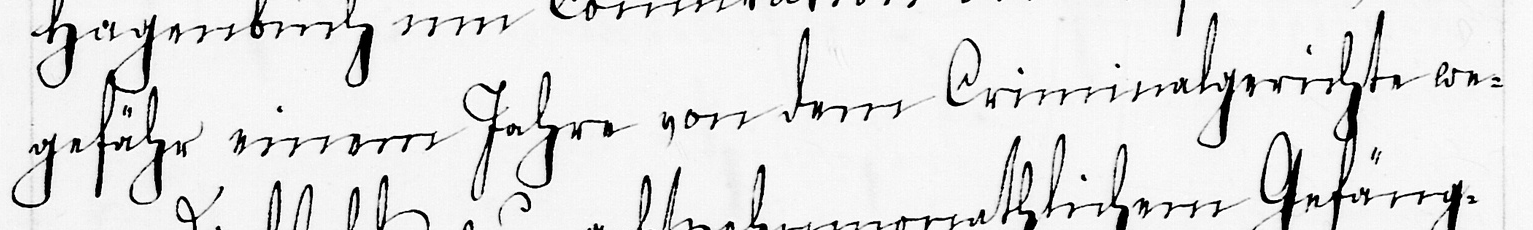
gefähr einem Jahre von dem Criminalgerichte we¬
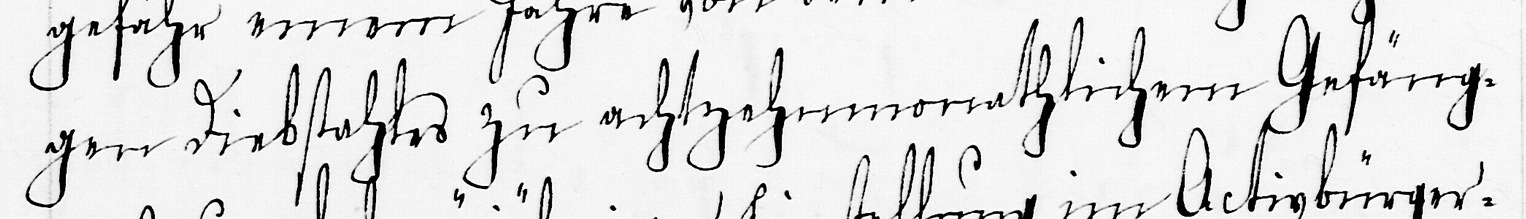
gen Diebstahles zu achtzehnmonathlichem Gefäg¬
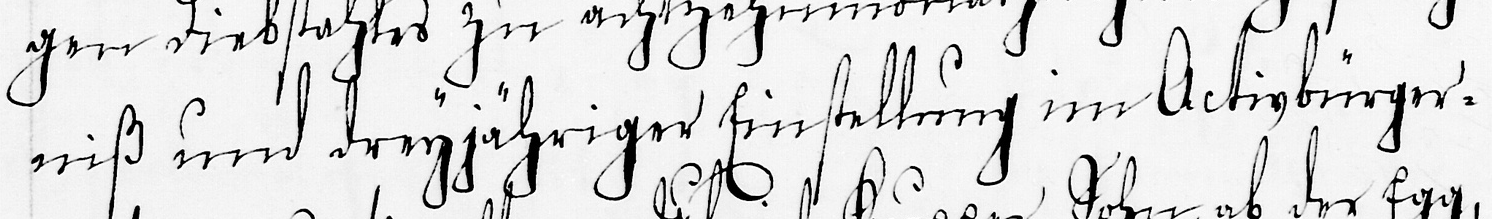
niß und dreyjähriger Einstellung im Activbürger¬
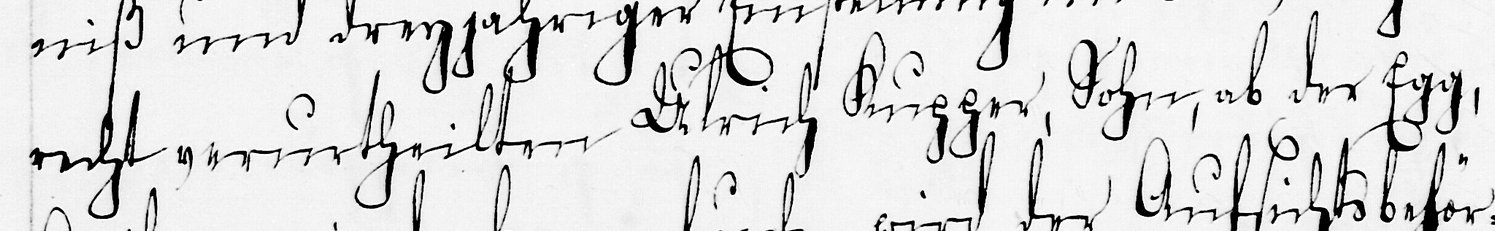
recht verurtheilten Ulrich Kupper, Sohn, ab der Egg,
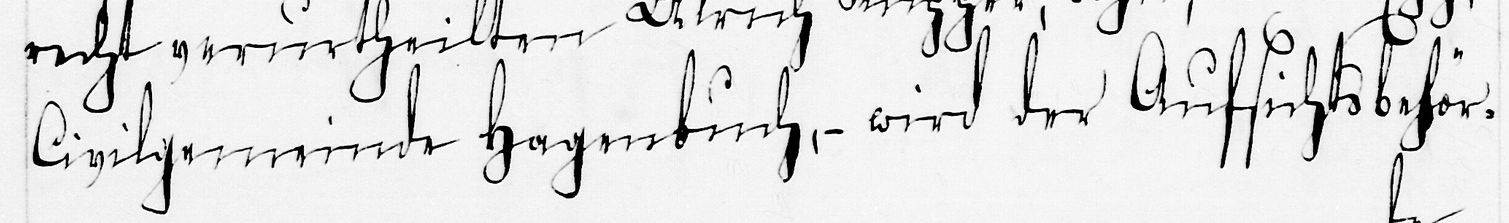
Civilgemeinde Hagenbuch, – wird der Aufsichtsbehör-
